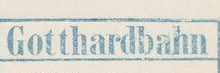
Monsieur Le Docteur
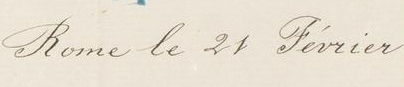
Rome le 21 Février
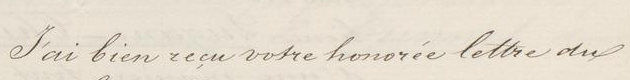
J'ai bien reçu votre honorée lettre du
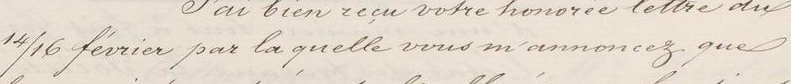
14/16 février par la quelle vous m'annoncez que
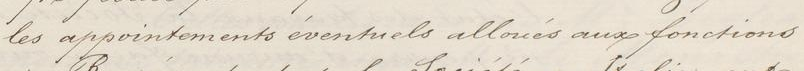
les appointements éventuels alloncés aux fonctions
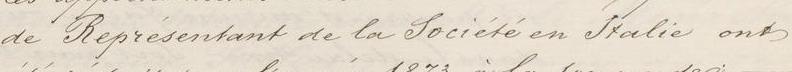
de Représentant de la Société en Italie ont
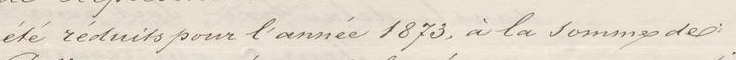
été réduits pour l'annnée 1873, à la sommes des –
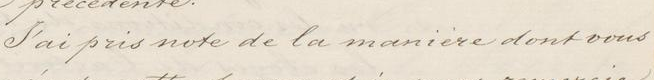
J'ai pris note de la manière dont vous
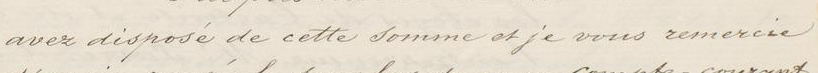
avez disposé de cette somme et je vous remercie
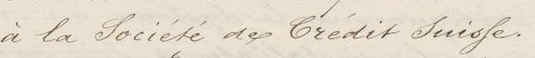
à la Société de Crédit Suisse.
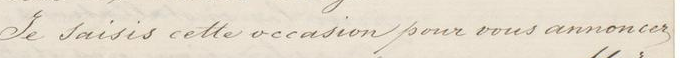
Je saisis cette occasion pour vous annoncer
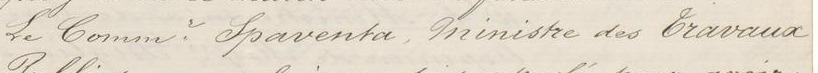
Le CommrSpaventa, Ministre des Travaux
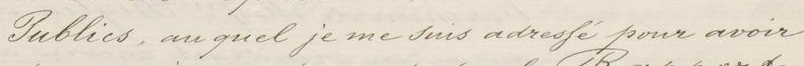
Publics, au quel je me suis adressé pour avoir
